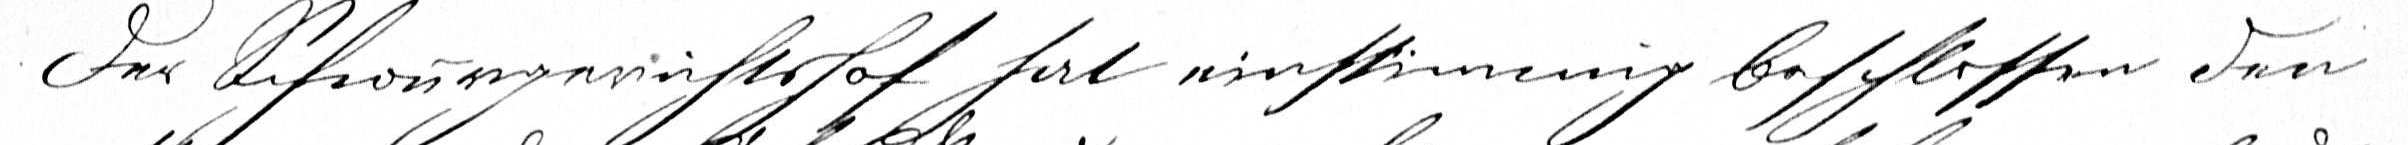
Die Schwurgerichtshof hat einstimmig beschlossen den
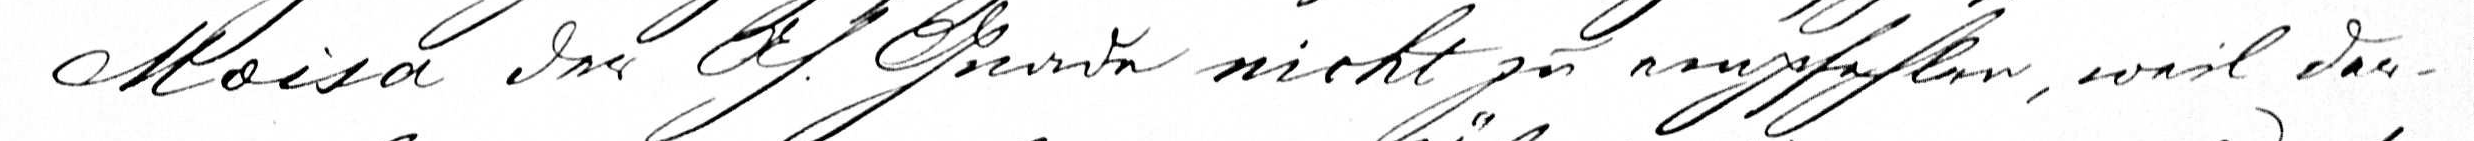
Moisa der Ah. Gnade nicht zu empfehlen, weil der¬
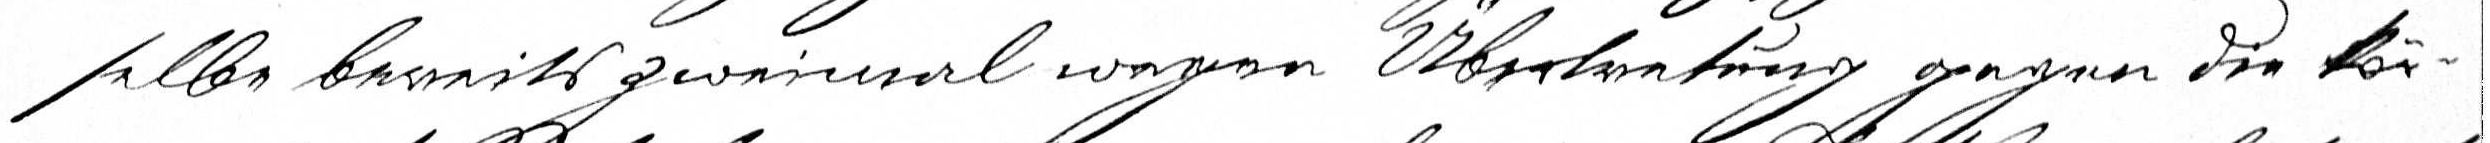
selbe bereits zweimal wegen Übertretung gegen die kör¬
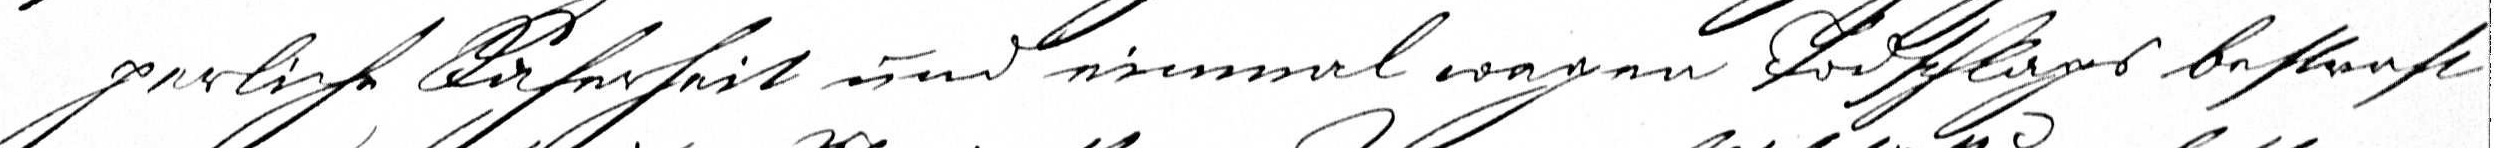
perliche Sicherheit und einmal wegen Todschlages bestraft
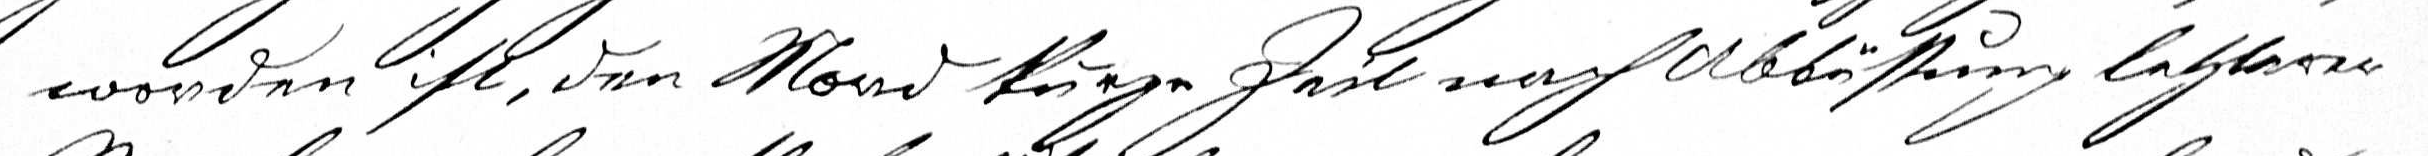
worden ist, den Mord kürze Zeit nach Abbüßung letzterer
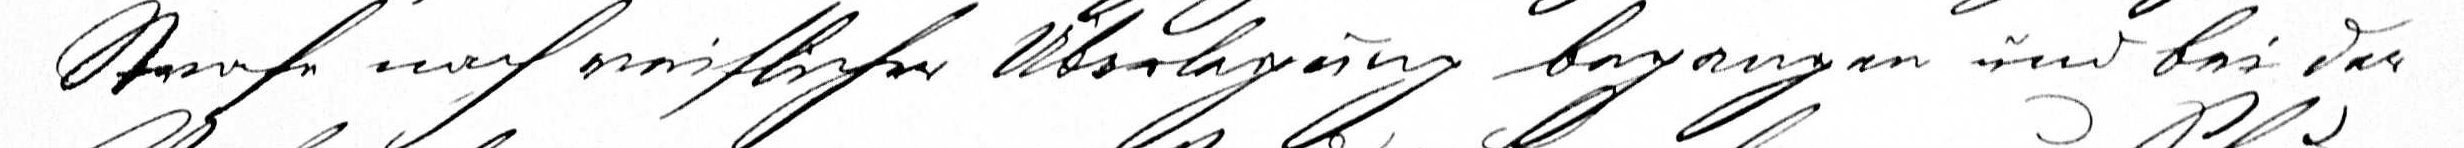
Strafe nach reiflicher Überlegung begangen und bei der
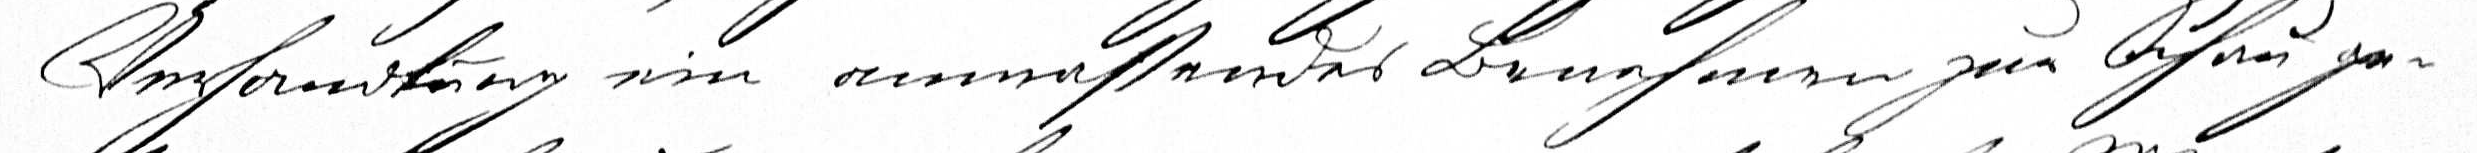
Verhandlung ein anmaßendes Benehmen zur Schau ge¬
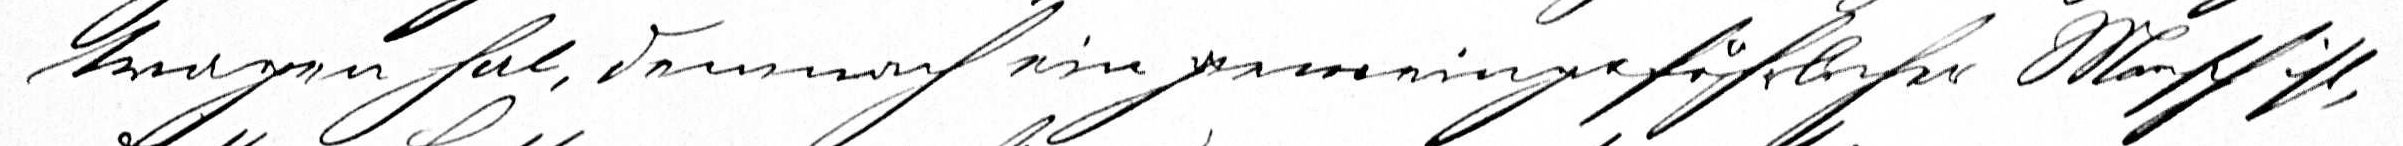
tragen hat, demnach ein gemeingefährlicher Mensch ist,
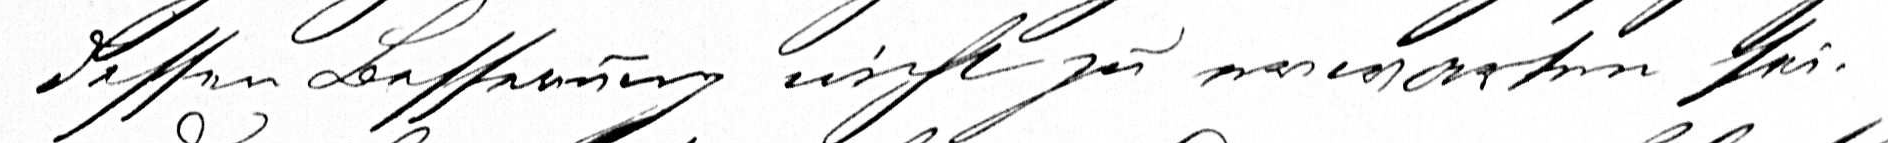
dessen Besserung nicht zu erwarten sei.
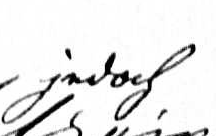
jedoch
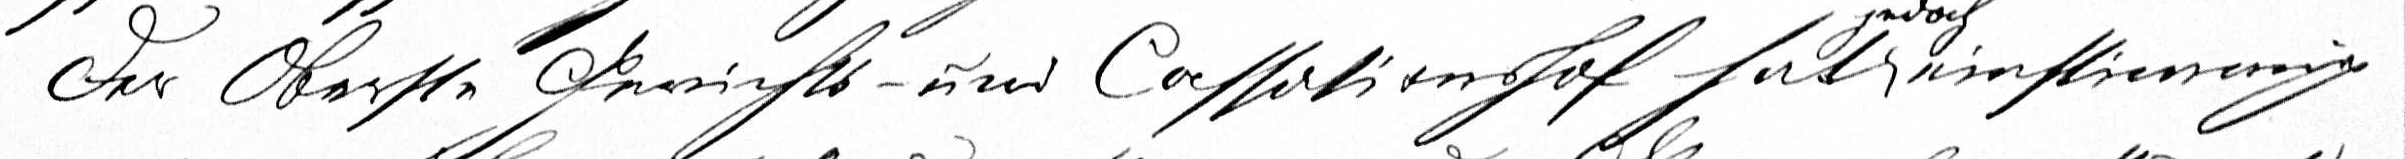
Der Oberste Gerichts- und Cassationshof hat einstimmig
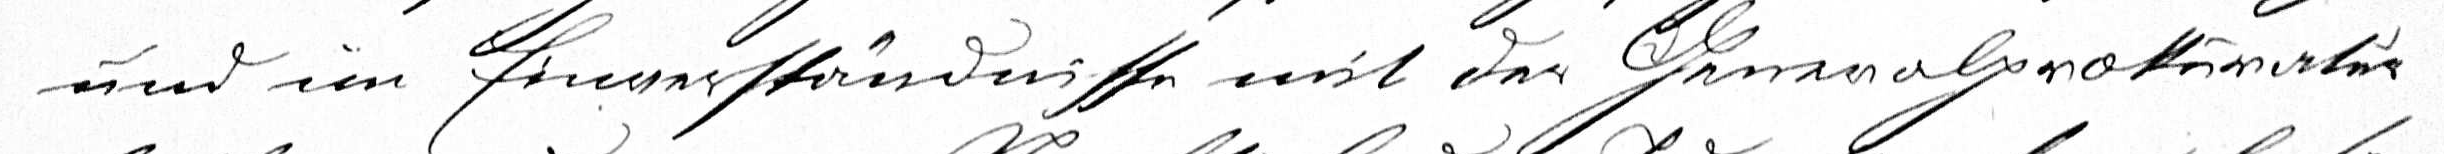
und im Einverständnisse mit der Generalprokuratur
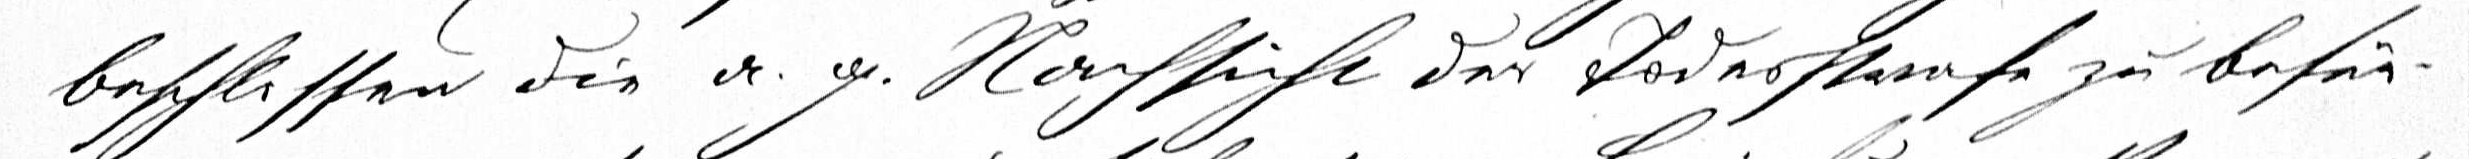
beschlossen die a.g. Nachsicht der Todesstrafe zu befür¬
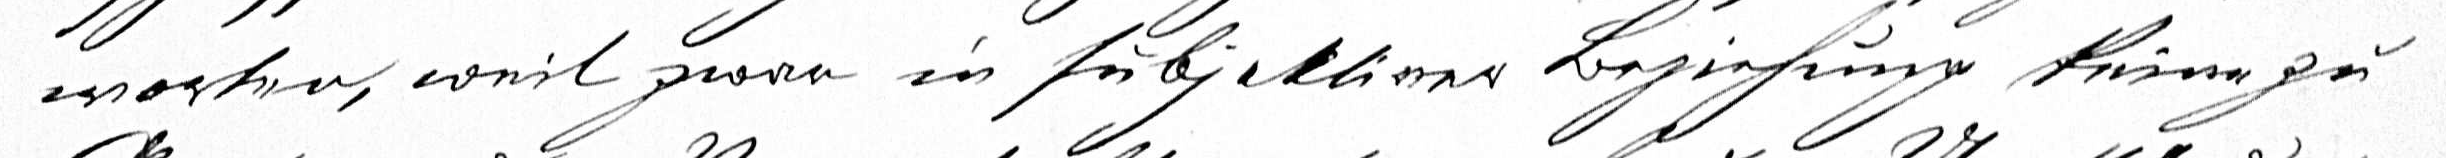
worten, weil zwar in subjektiver Beziehung keiner zu
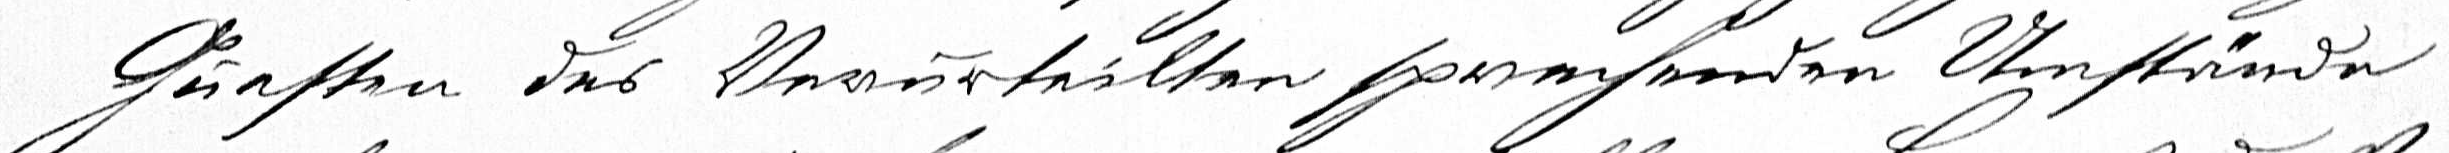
Gunsten des Verurtheilten sprechenden Umständen
